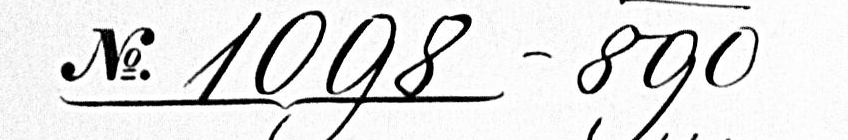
N° 1098 - 890
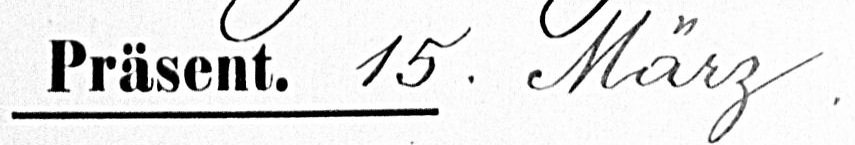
Präsent. 15. März.
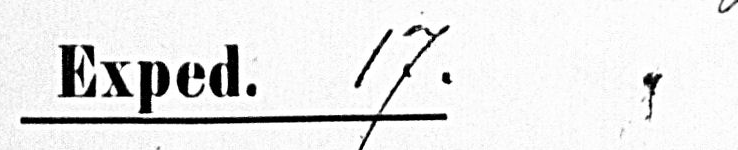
Exped. 17. März.
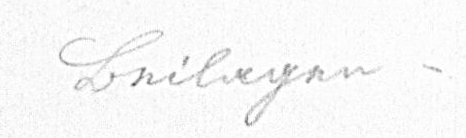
Beilagen
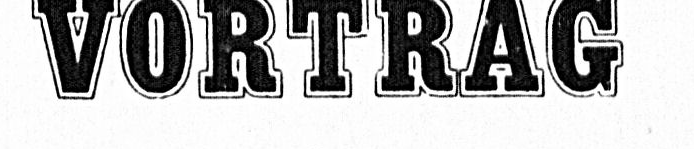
VORTRAG
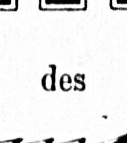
des
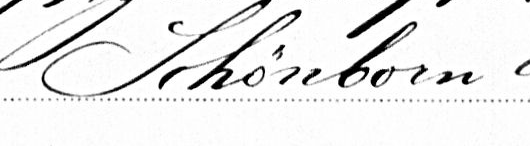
Schönborn
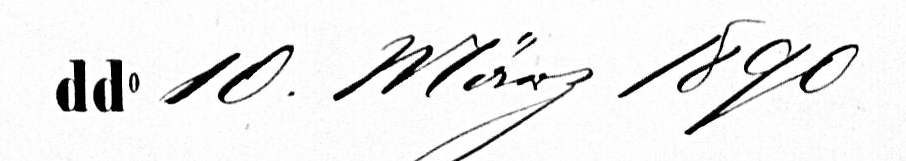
dd° 10. März. 1890
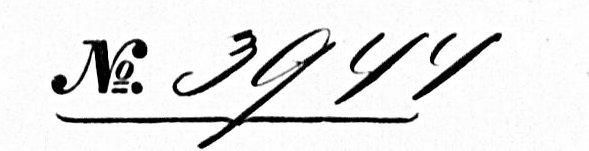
N° 3944
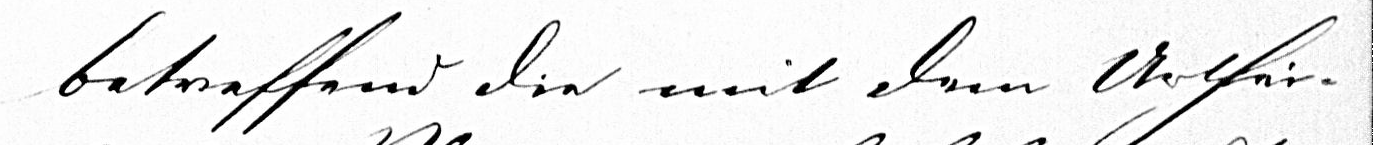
betreffend die mit dem Urtei¬
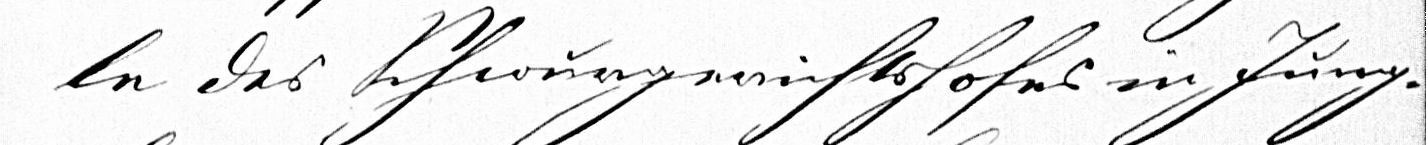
le des Schwurgerichtshofes in Jung¬
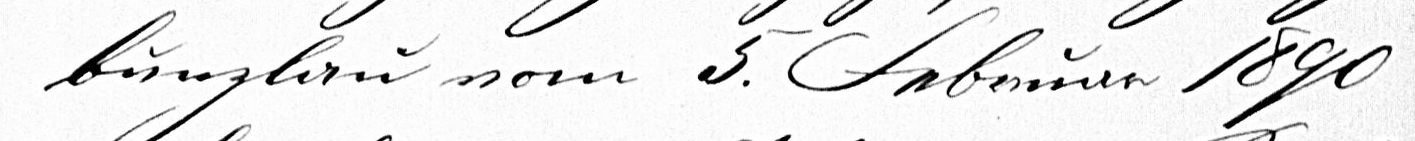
bunzlau vom 5. Februar 1890
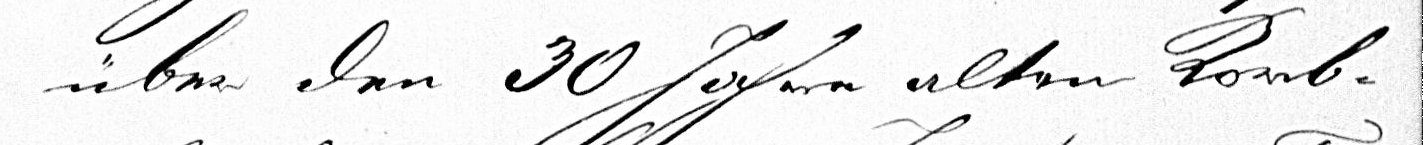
über den 30 Jahre alten Korb¬
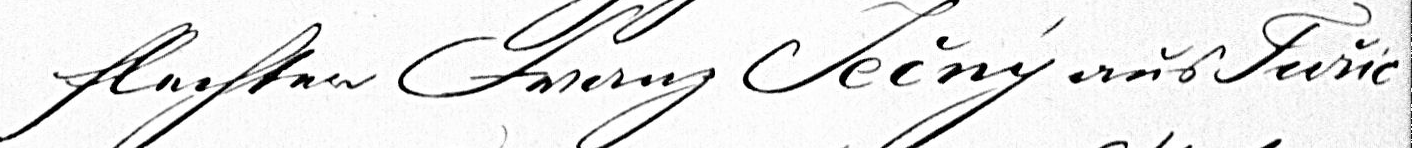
flechten Franz Jecný aus Turic
